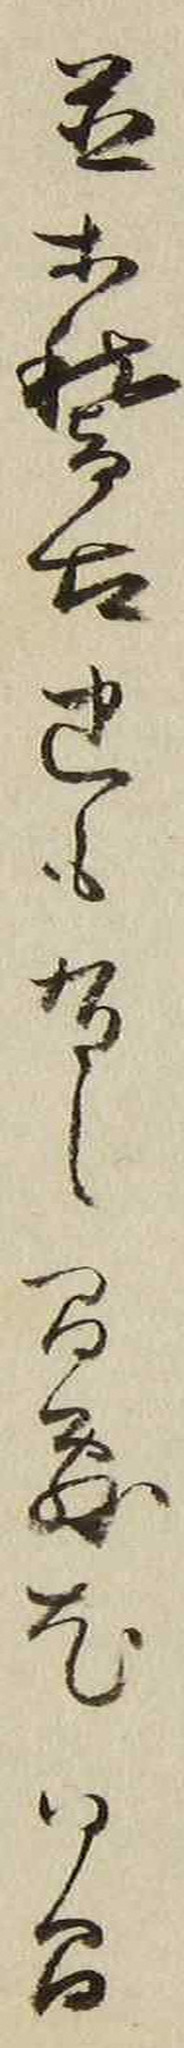並等稽古迚も有之間敷尤日間
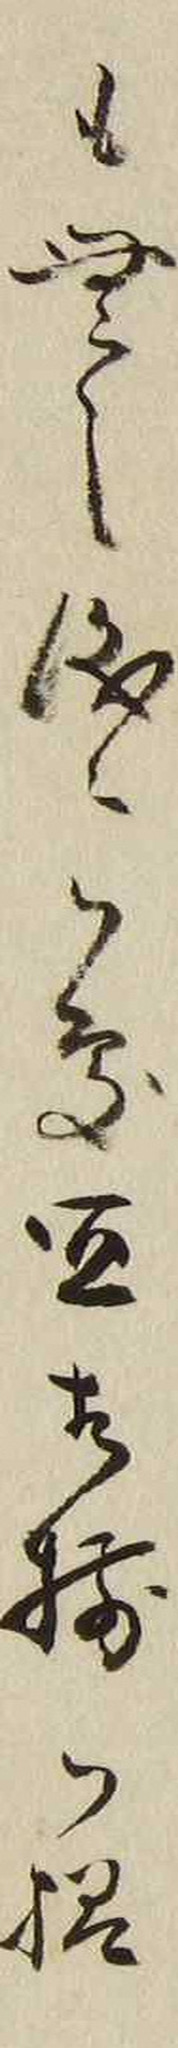も無之儀ニ候処宜相揃候様
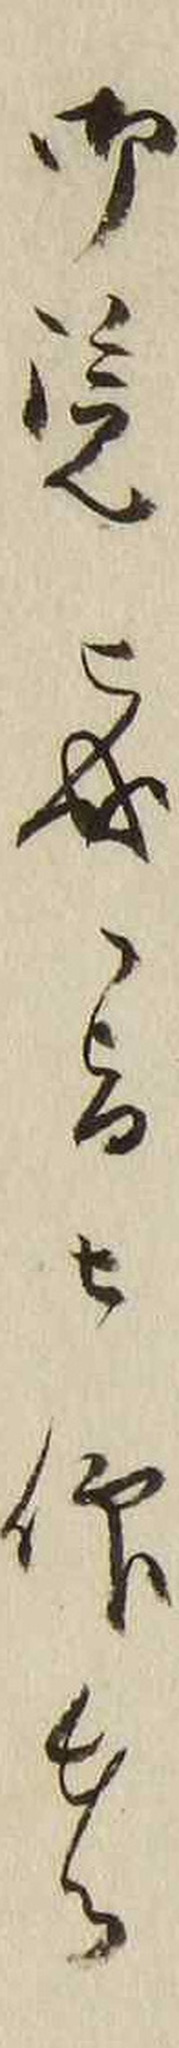御覧被成候旨被仰出候

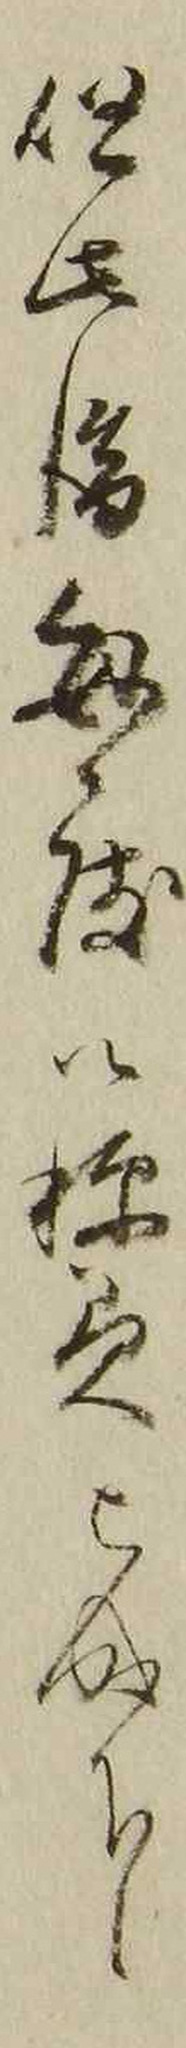但此後毎度御褒美被成下候
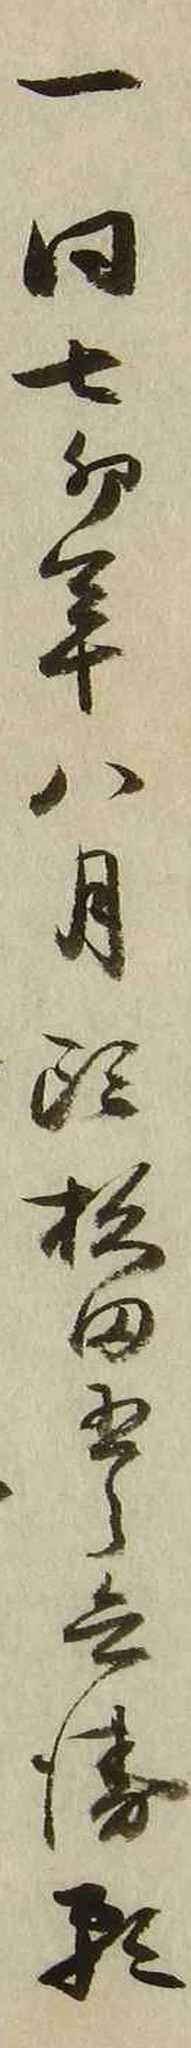一同七卯年八月頭杉田五郎兵衛願
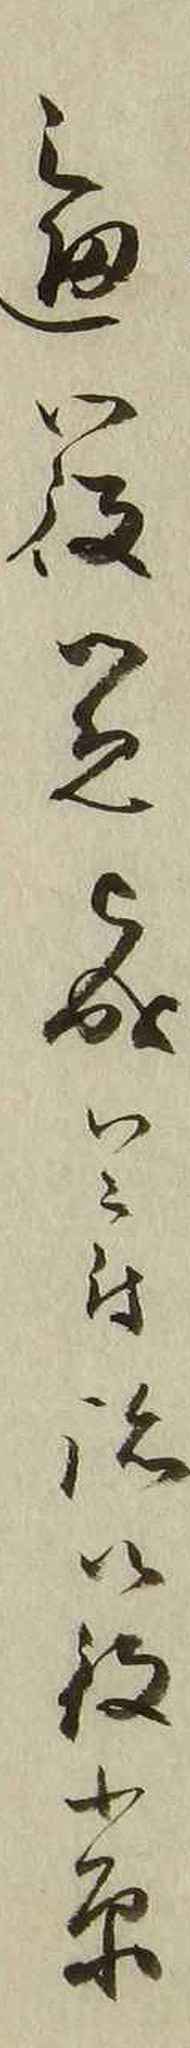之通御役御免被成候ニ付跡御役小原
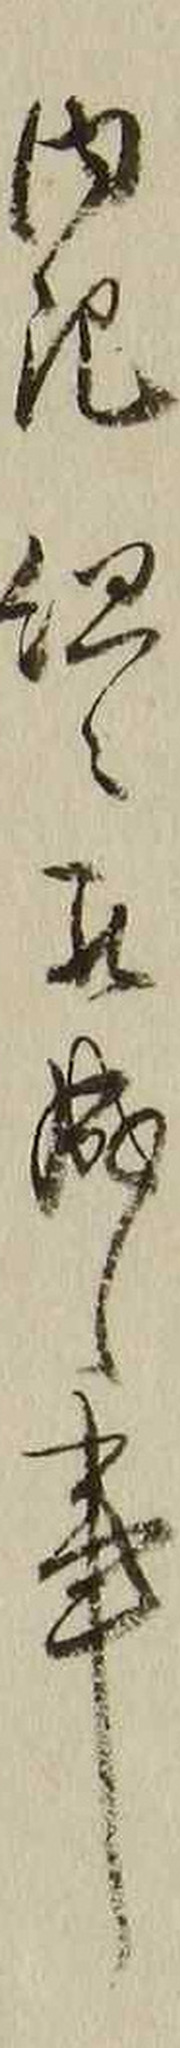内記組ニ罷成候事
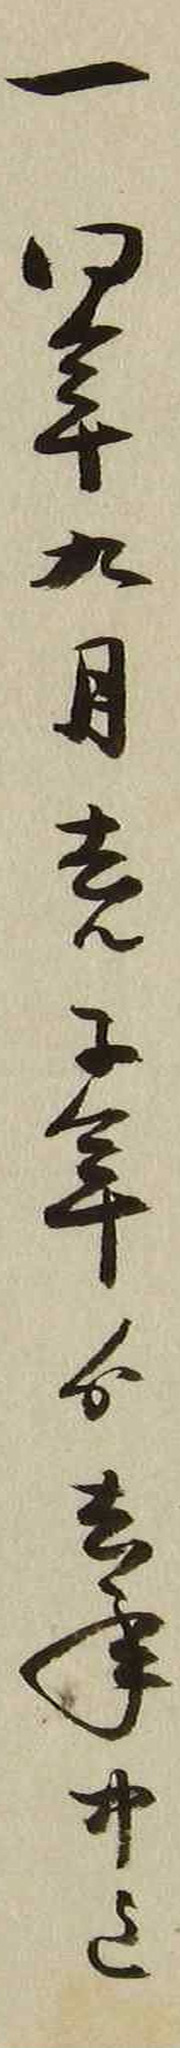一同年九月去ル子年ゟ去年中迄
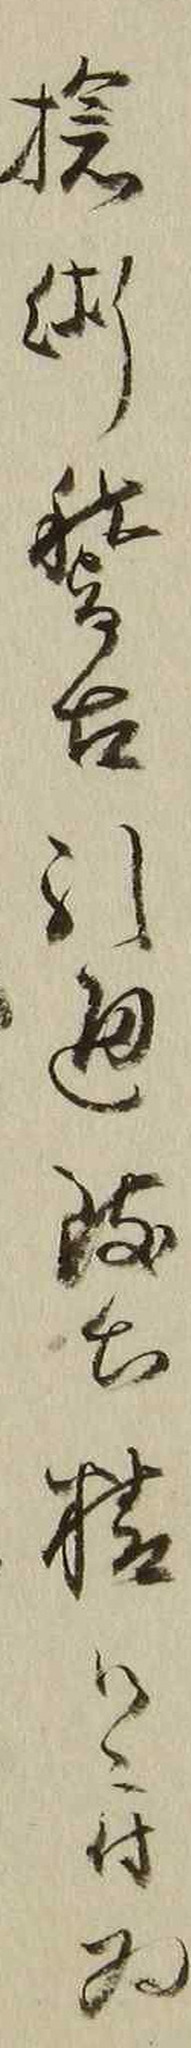槍術稽相引通致出精候ニ付為
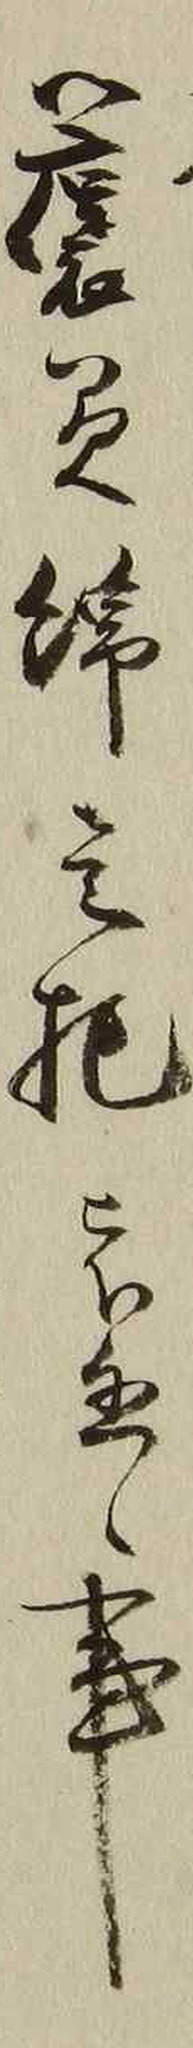御褒美綿壱把被下置候事
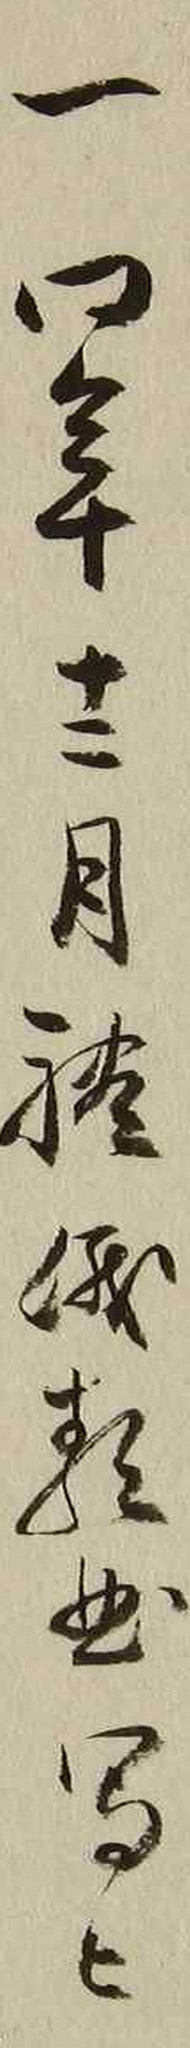一同年十二月礼儀類曲写被
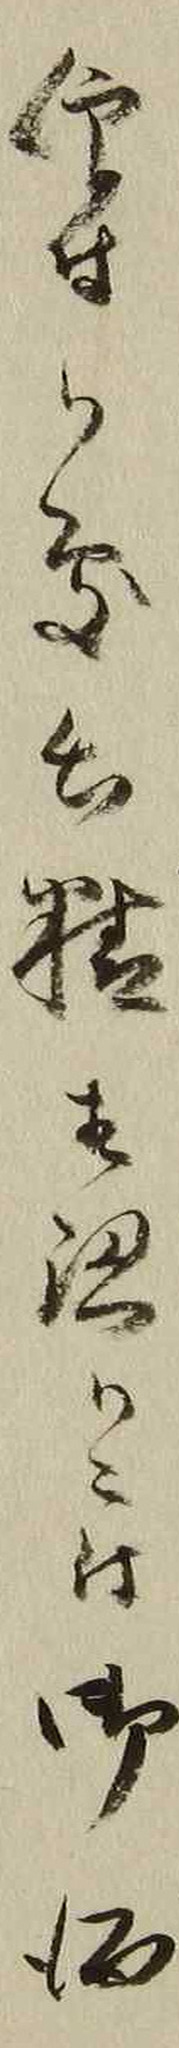仰付候処出精相認候ニ付御酒
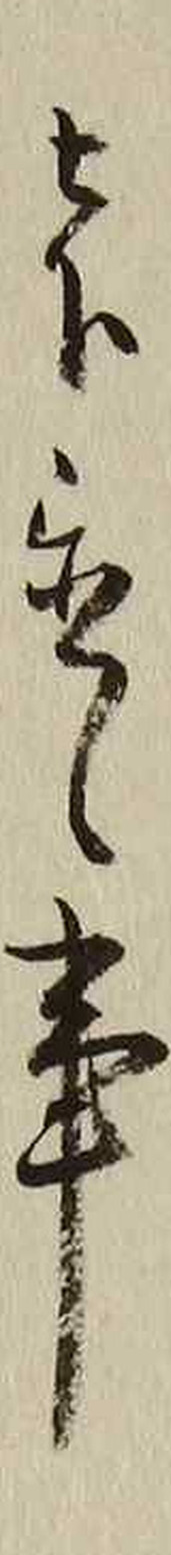被下置候事
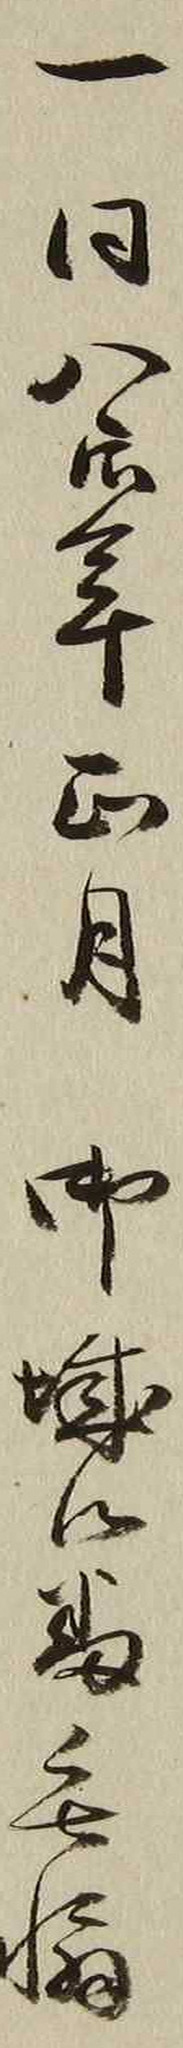一同八辰年正月御城御番無懈
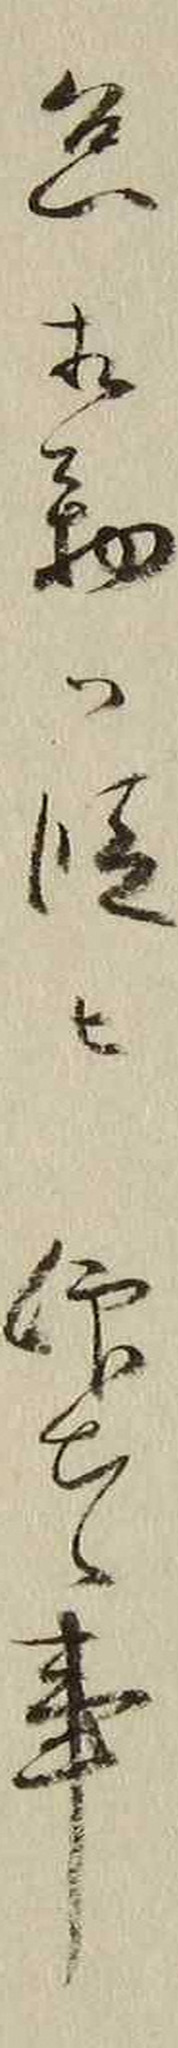怠相勤候段被仰出候事
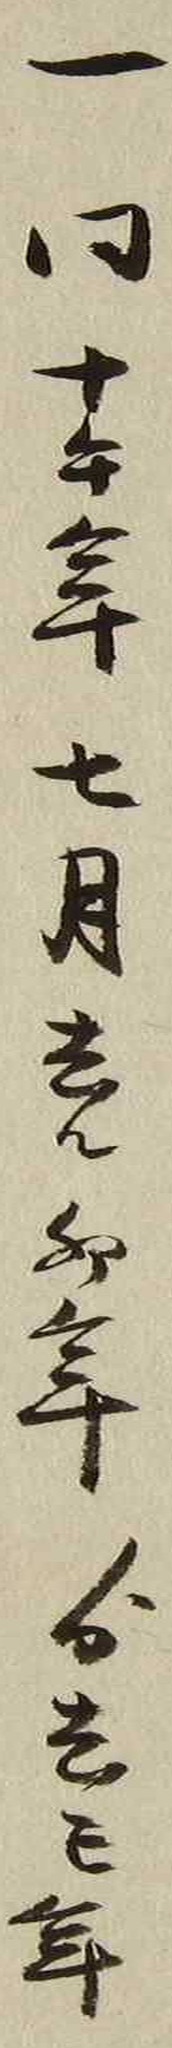一同十午年七月去ル卯年ゟ去巳年
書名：諸士系譜　巻之288　さ之部20
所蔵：会津若松市立会津図書館
